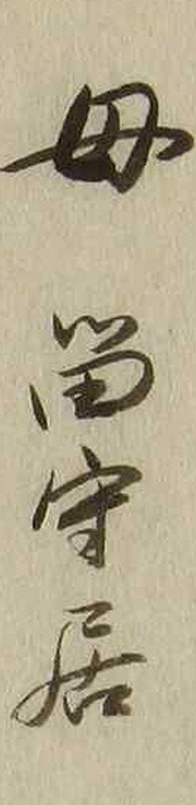母留守居
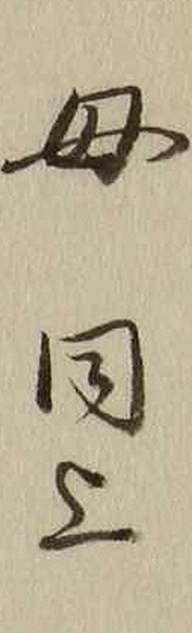母同上
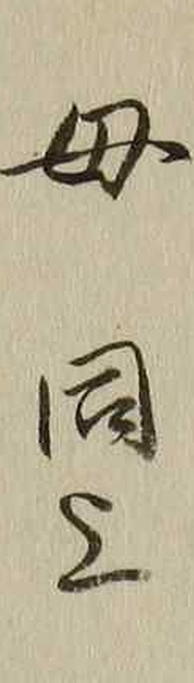母同上
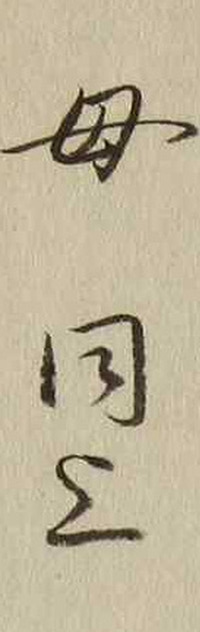母同上
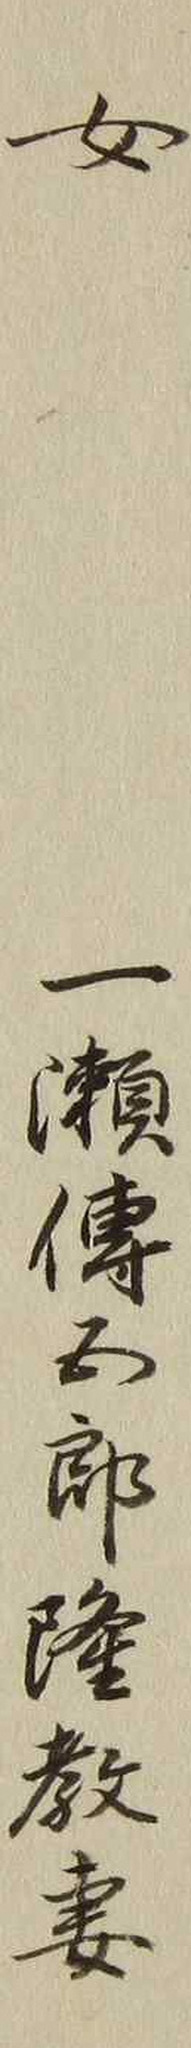女一瀬伝五郎降教妻
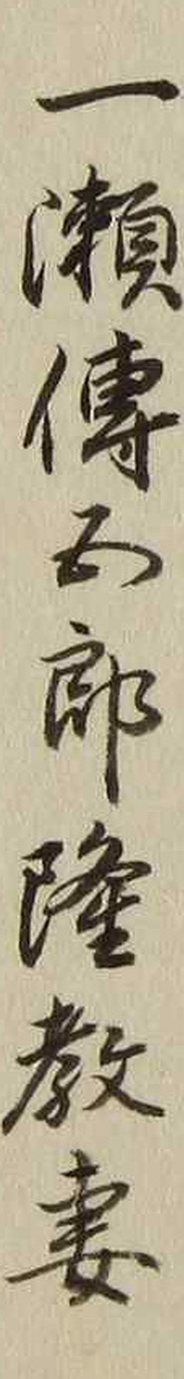女一瀬伝五郎降教妻
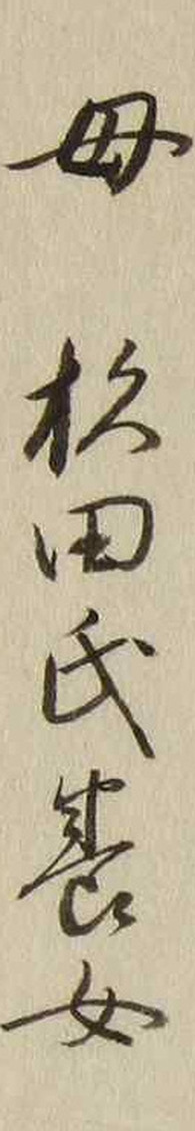母杉田氏養女

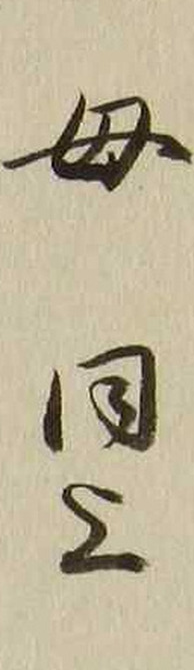母同上
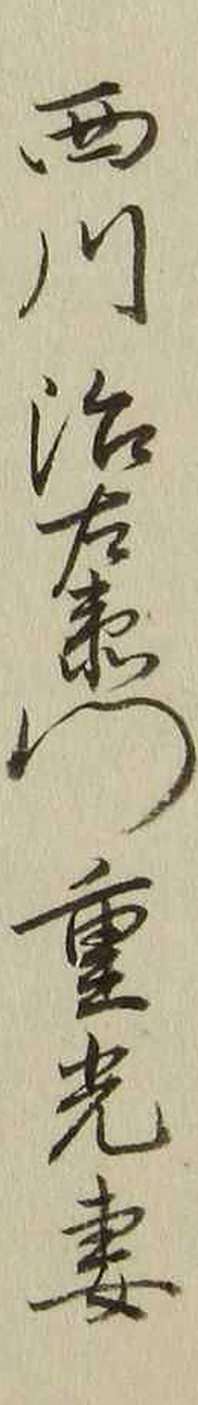女西川治右衛門重光妻
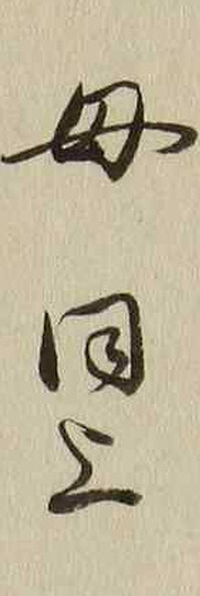母同上
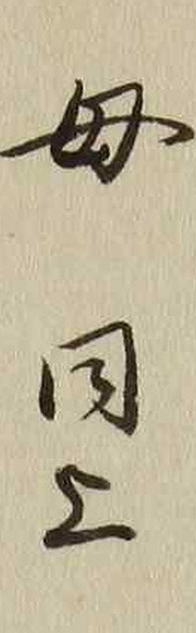母同上
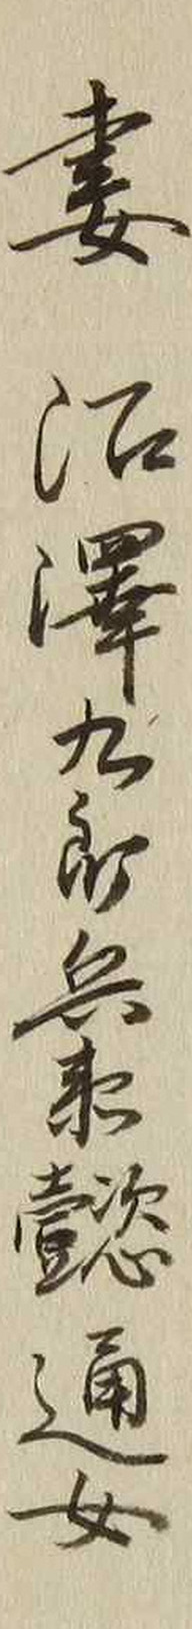妻沼沢九郎兵衛懿通女
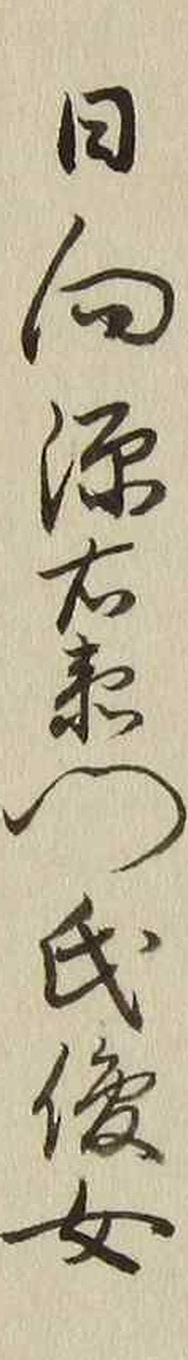日向源右衛門氏俊女
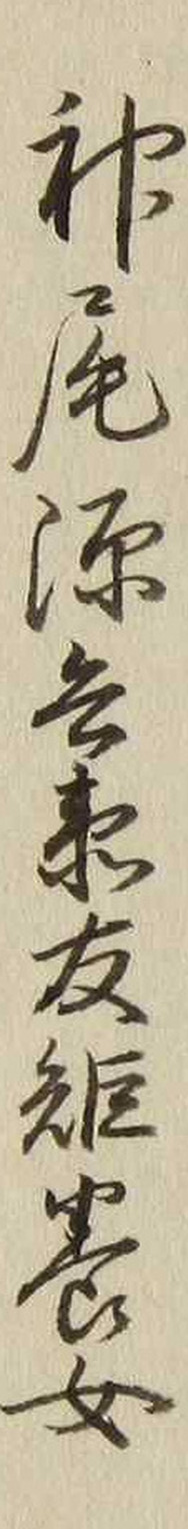神尾源兵衛友矩養女
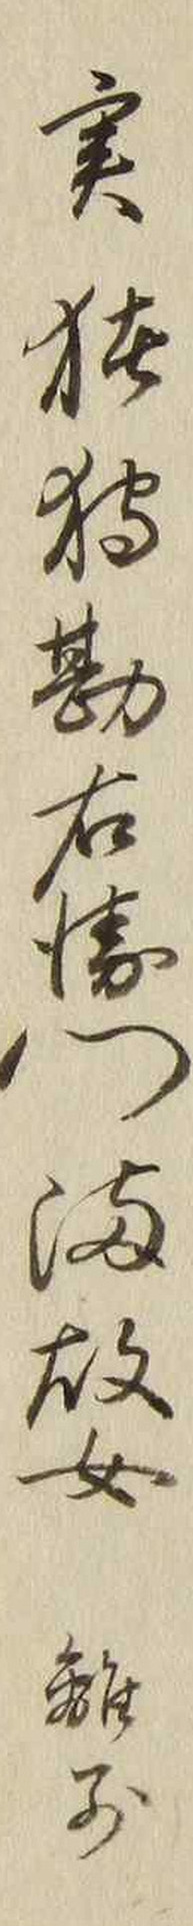実猪狩勘右衛門満故女離別
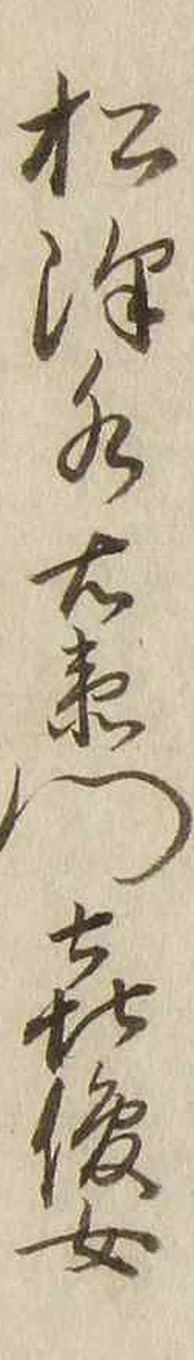松沢水右衛門喜俊女
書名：諸士系譜　巻之133　た之部9
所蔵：会津若松市立会津図書館
